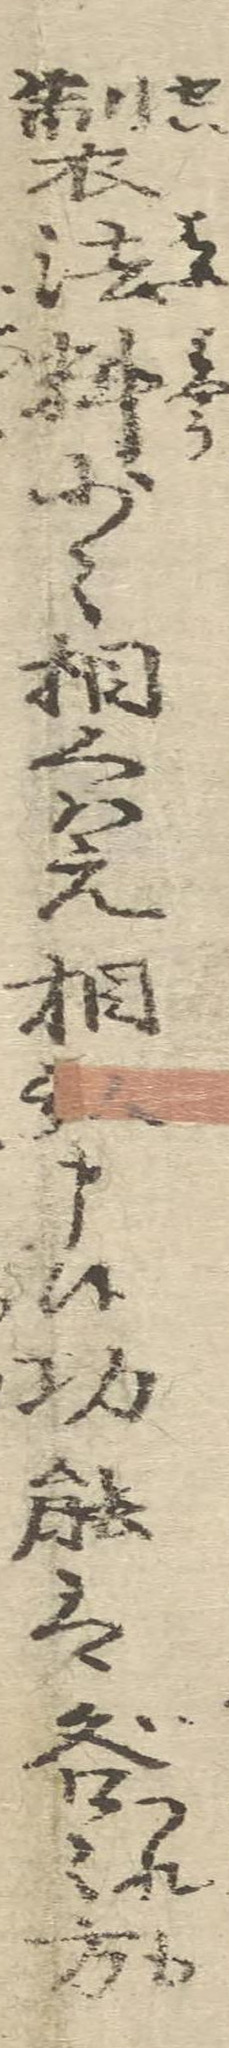製法料少々相くはえ相弘申候功能は各々方
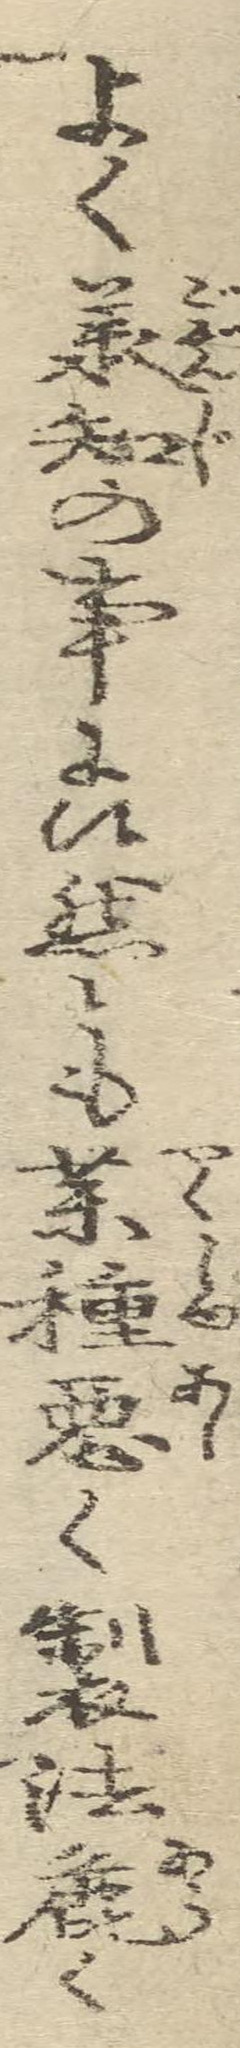よく承知の事に候然とも薬種悪く製法麁く
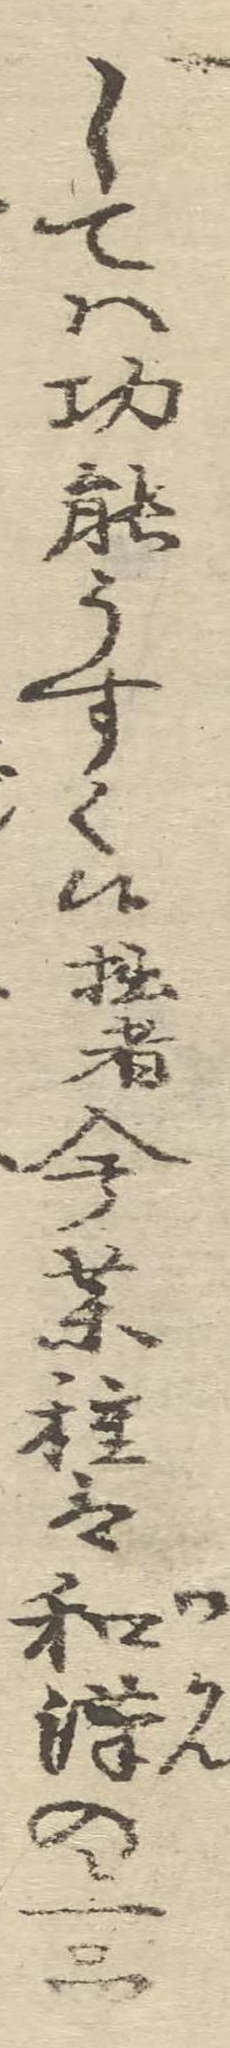しては功能うすく候拙者今薬種は和漢の上品
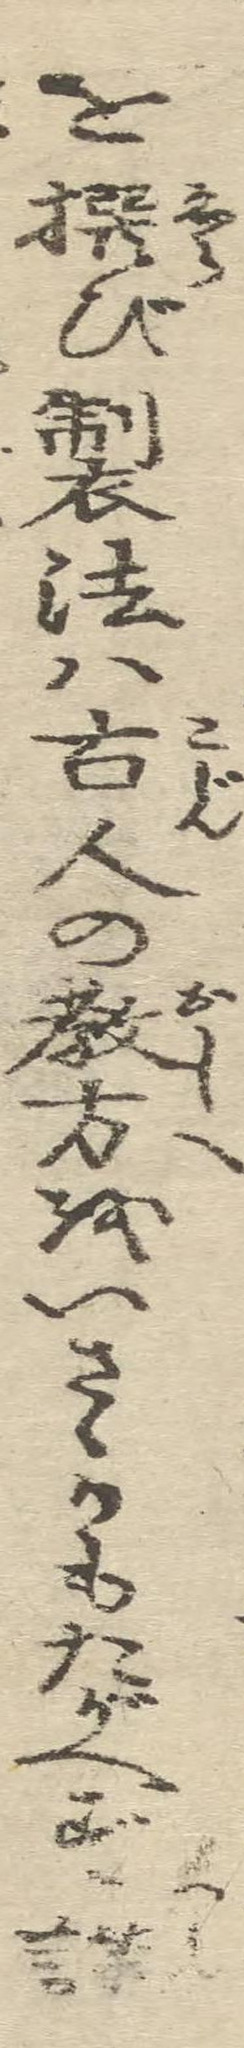を撰び製法は古人の教方をいさゝかもたがへず謹
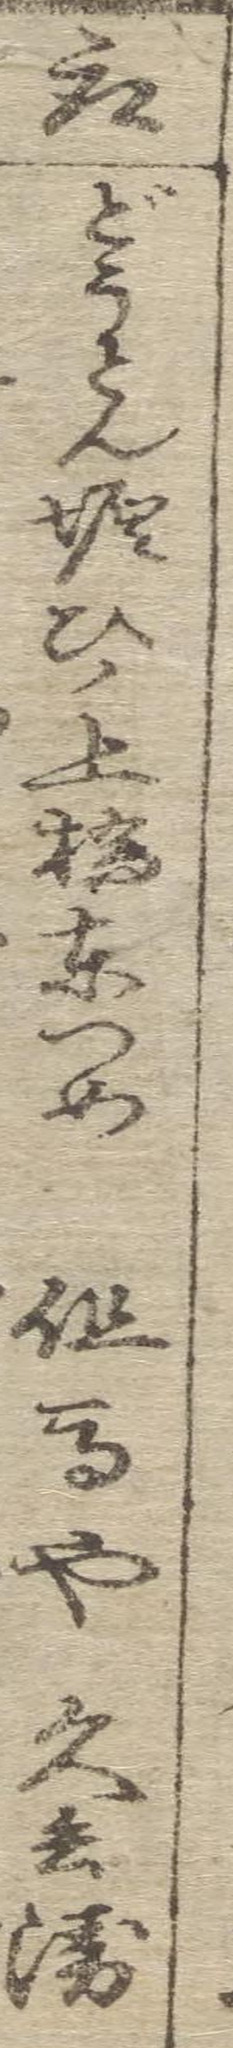どうとん堀ひの上橋東つめ但馬や久兵衛
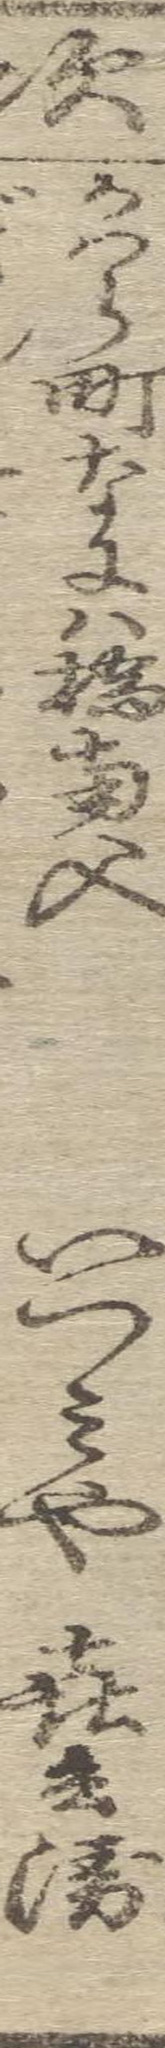かはら町なには橋南へ入いつみや喜兵衛
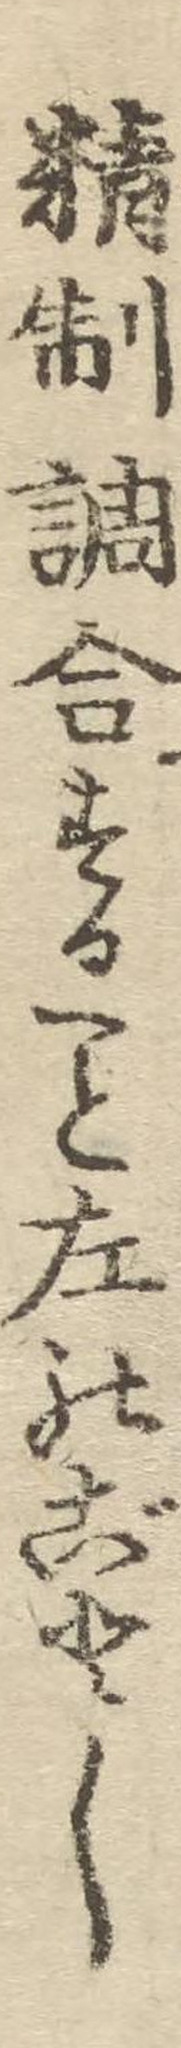精制調合すること左のごとし
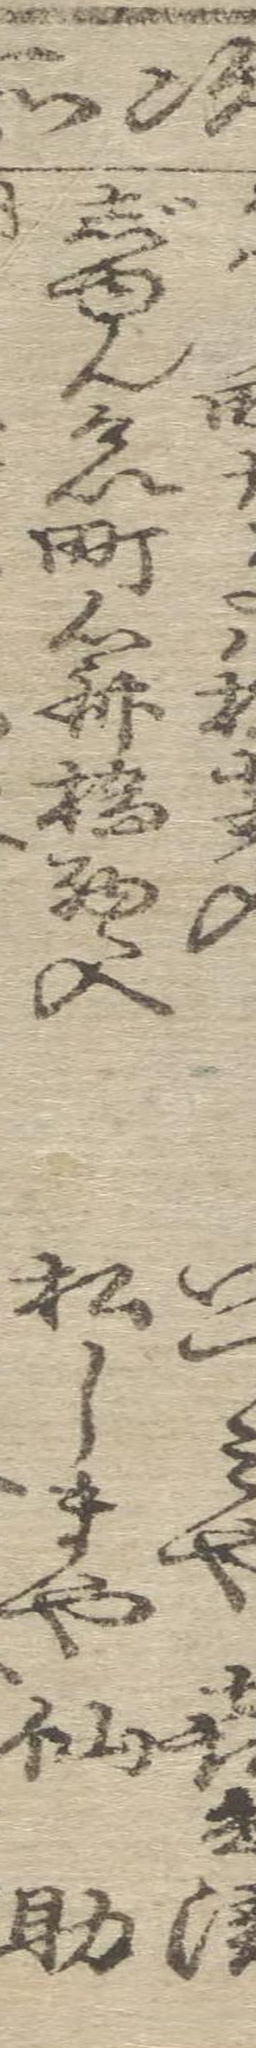じゆんけい町心斎橋西へ入松しまや仙助
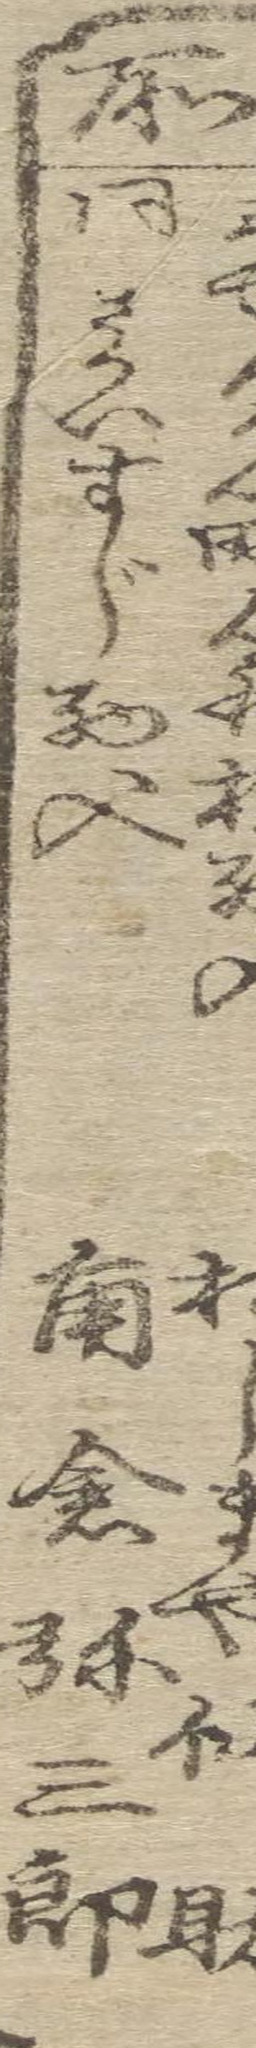同さかいすじ西へ入角倉弥三郎
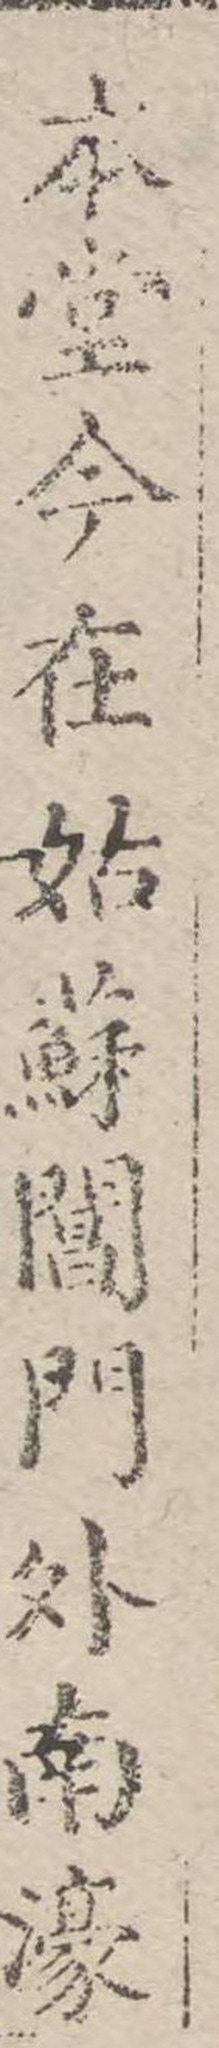本堂今在姑蘇閶門外南濠
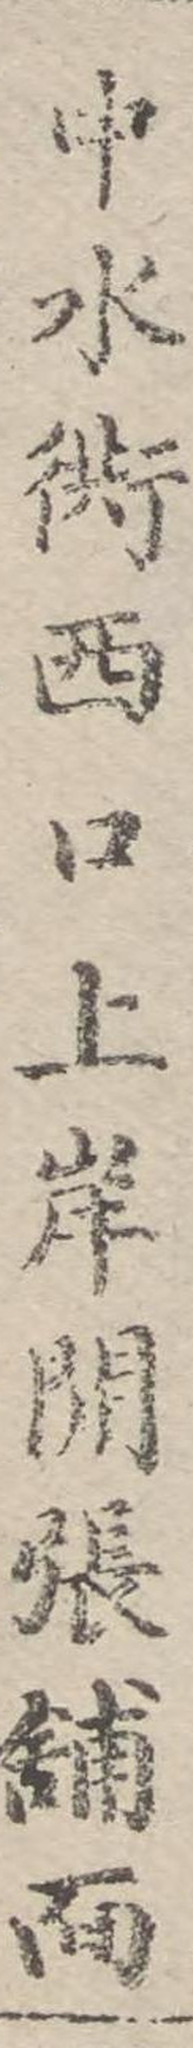中水衖西口上岸閒張舗面
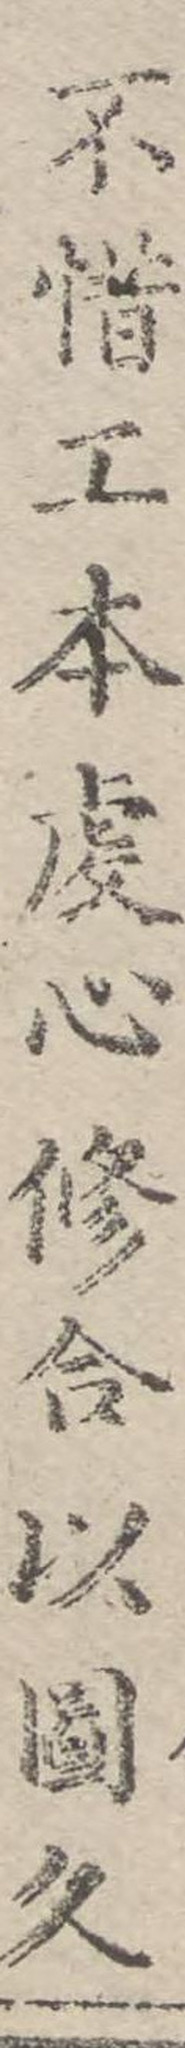不惜工本處心修合以図久
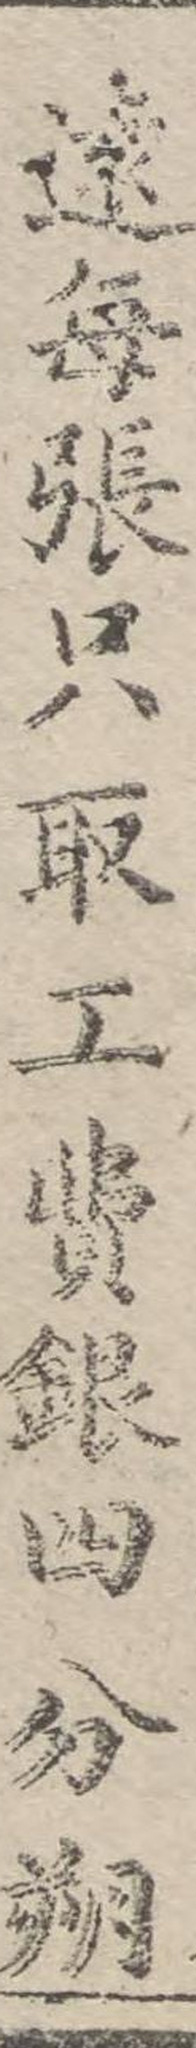遠毎張只取工費銀四分朔
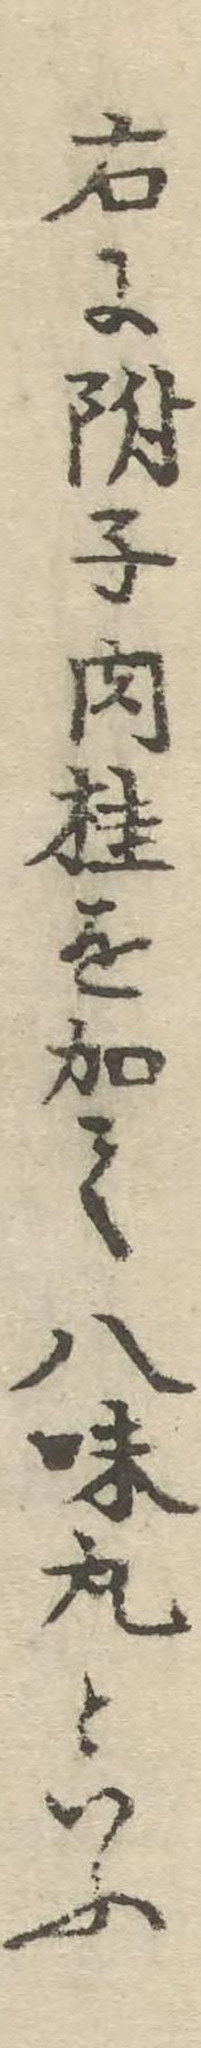右に附子肉桂を加て八味丸といふ
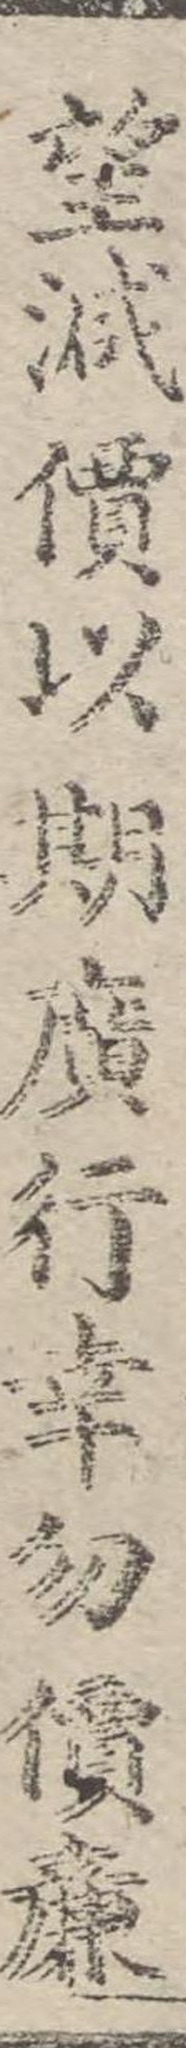望減価以期広行幸勿価廉廉
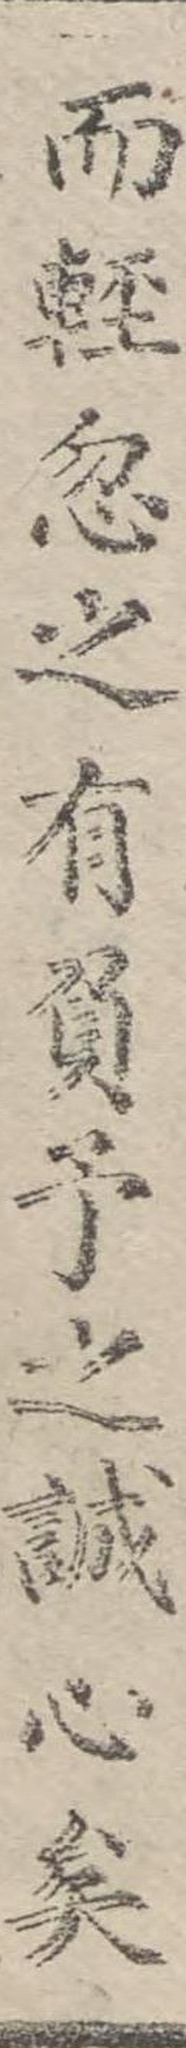而軽忽之有負予之誠心矣
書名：浪華薬種問屋能書張交帖. 二
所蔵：国立国会図書館 National Diet Library, JAPAN
